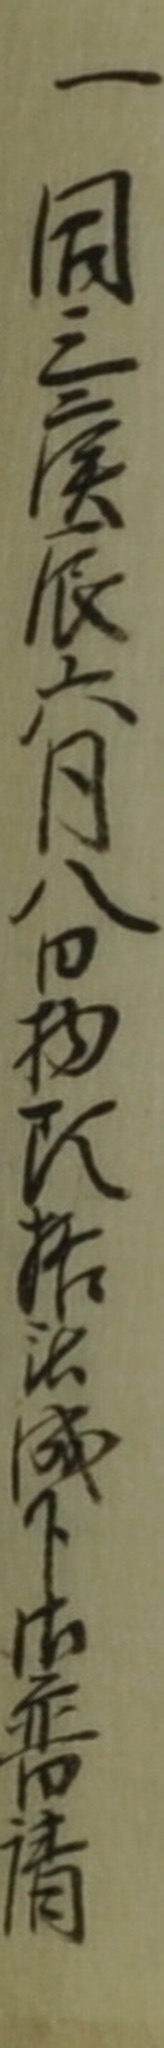一同三庚辰六月八日物頭格被成下御普請
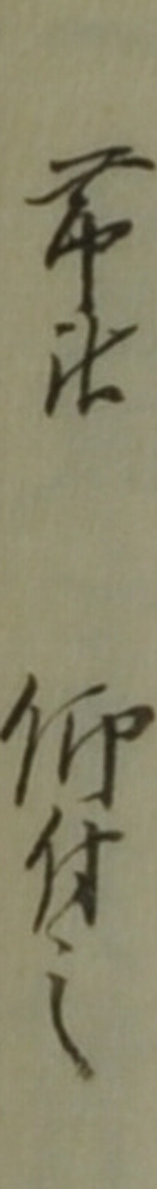帯被仰付之
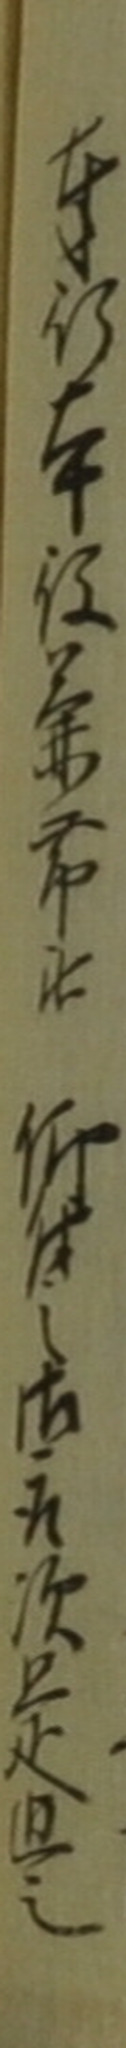奉行本役兼帯被仰付之御取次是迄之
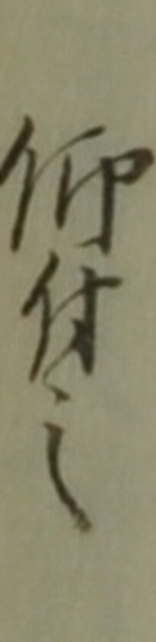仰付之
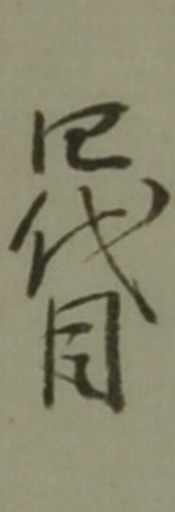四代目
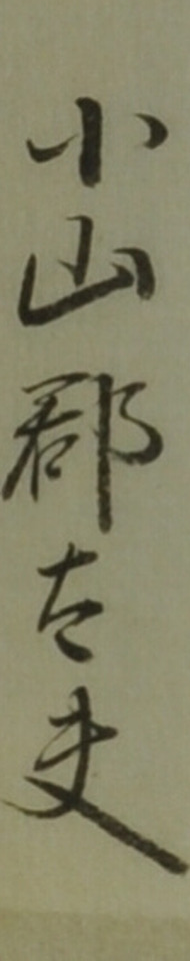小山郡太夫
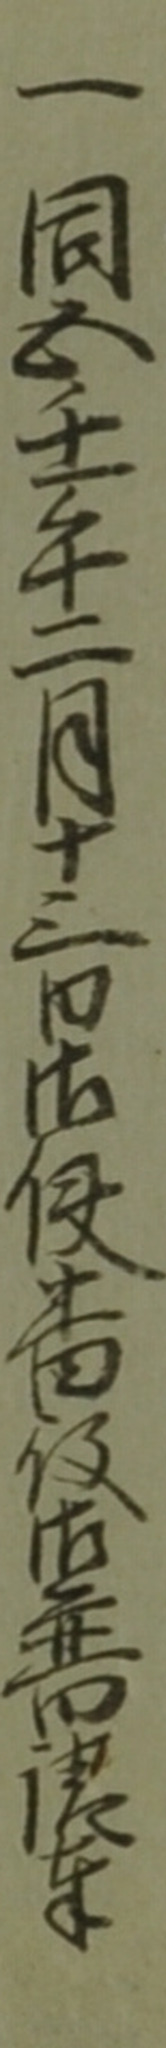一同五壬午二月十三日御使番役御普請奉
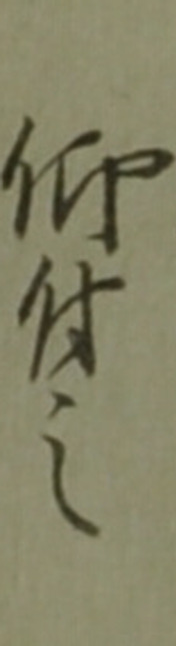仰付之
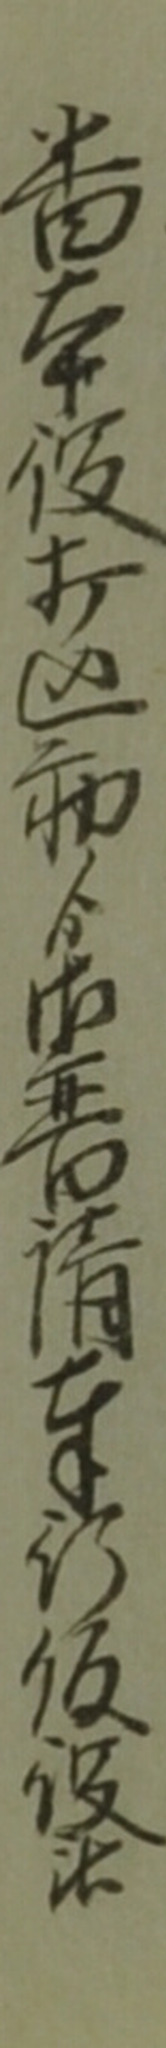番本役打込勤ゟ御普請奉行仮役被
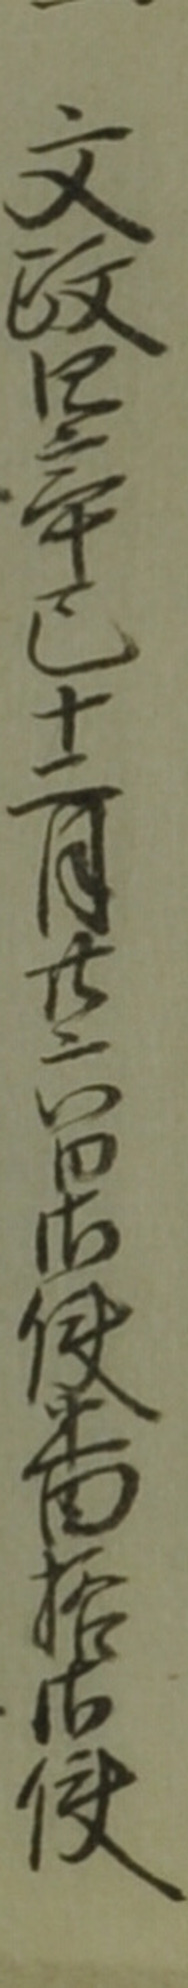一文政四辛巳十二月廿六日御使番格御使
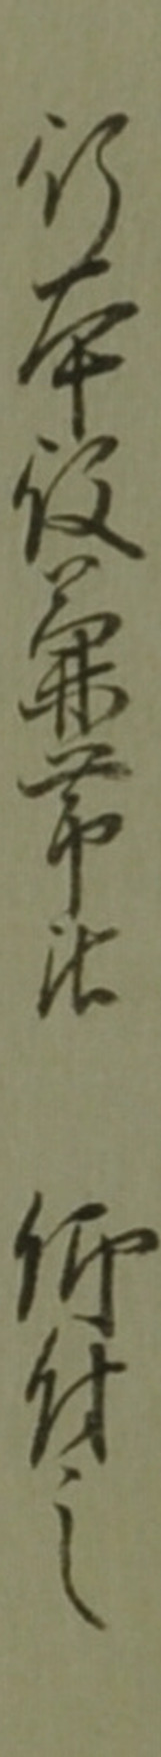行本役兼帯被仰付之
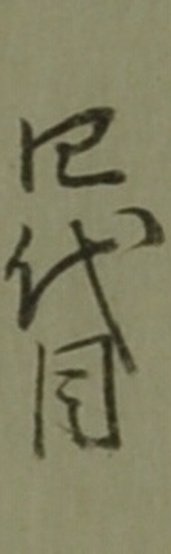四代目
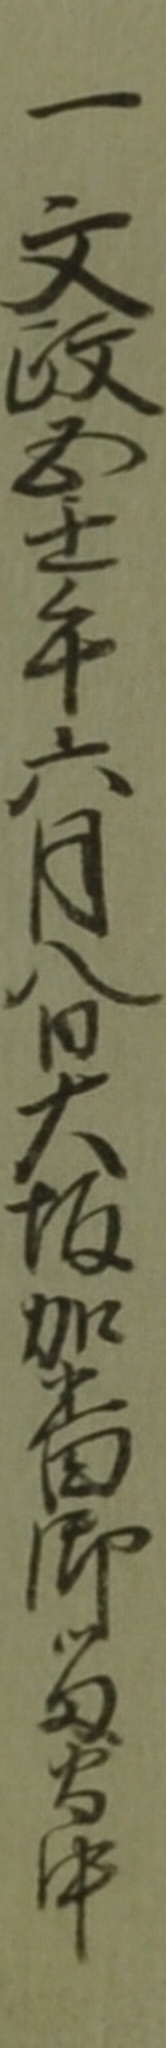一文政五壬午六月八日大坂加番御留守中
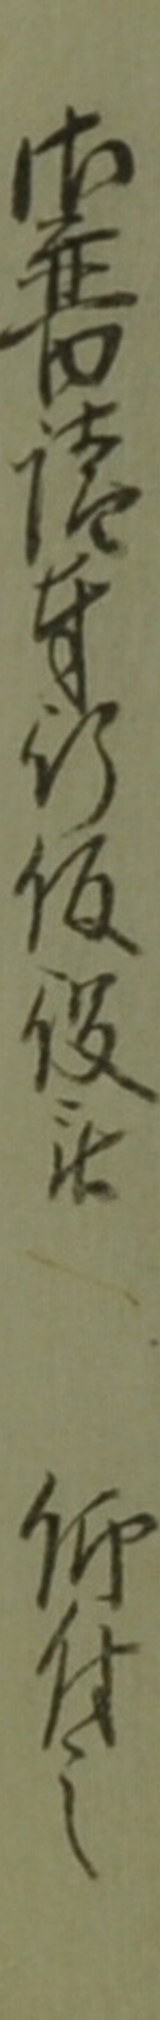御普請奉行仮役被仰付之
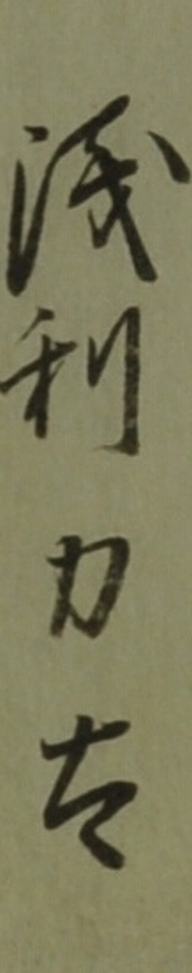浅利力太
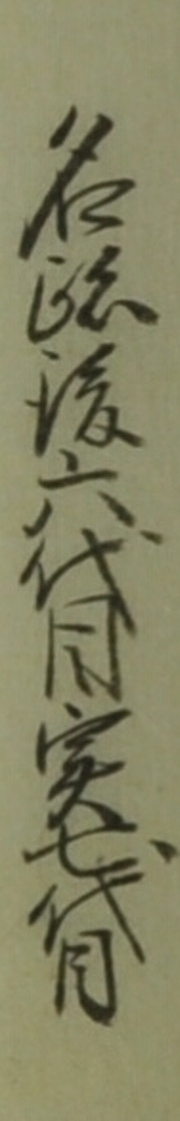名跡後二代目実七代目
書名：諸御役代々録（六）
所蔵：伊那市立高遠町図書館・合同会社AMANE
